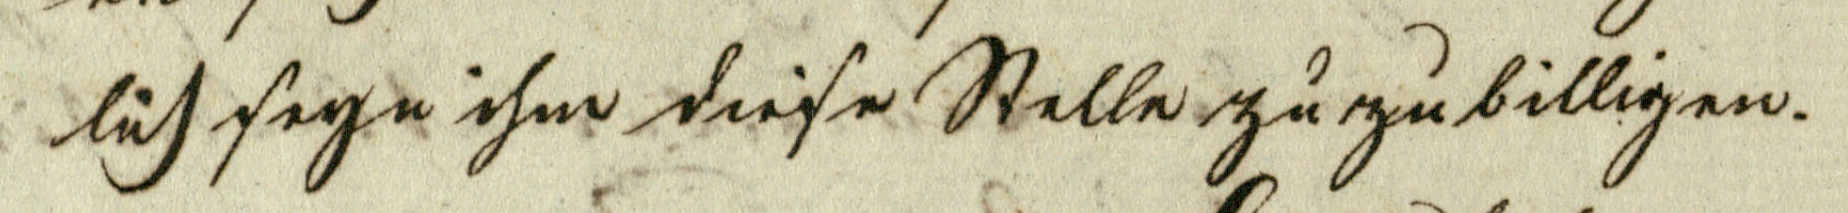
lich seyn ihm diese Stelle zu zubilligen.
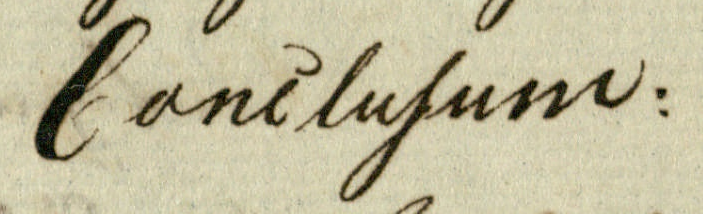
Conclusum:
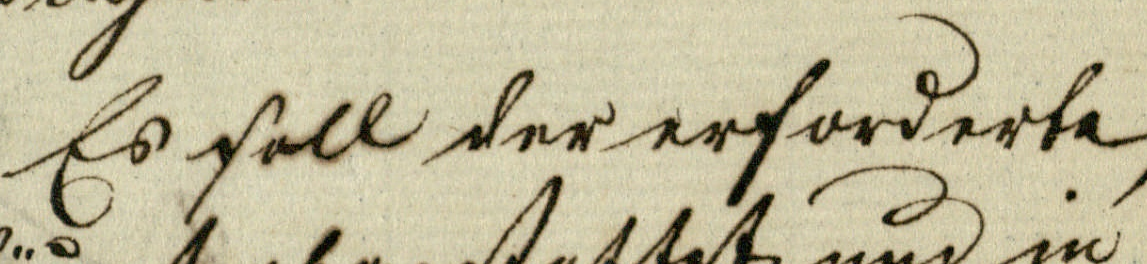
Es soll der erforderte
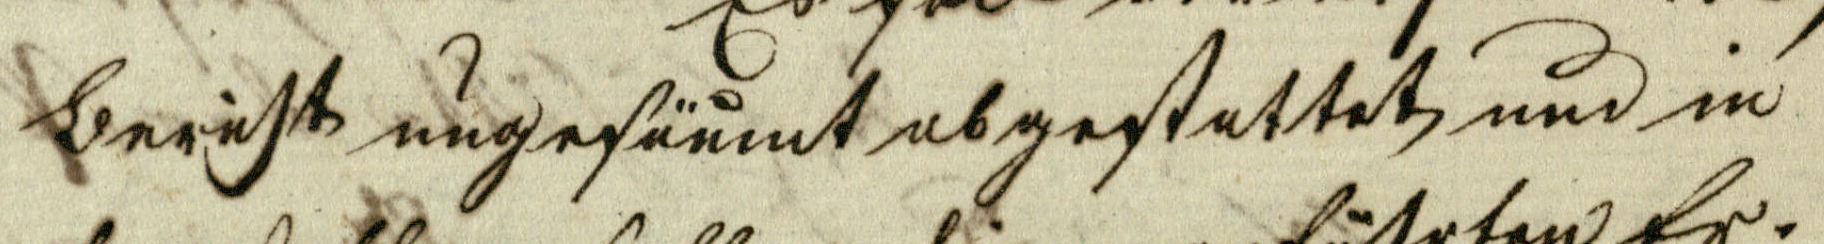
Bericht ungesäumt abgestattet und in
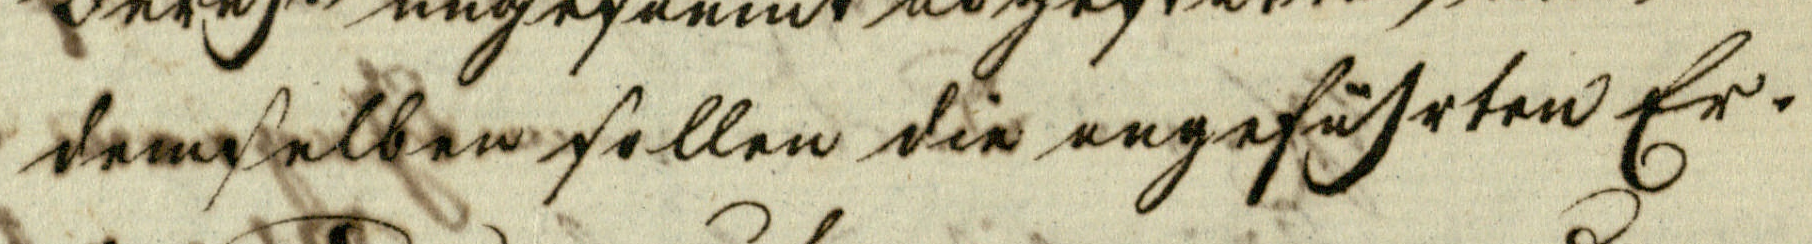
demselben sollen die angeführten Er¬
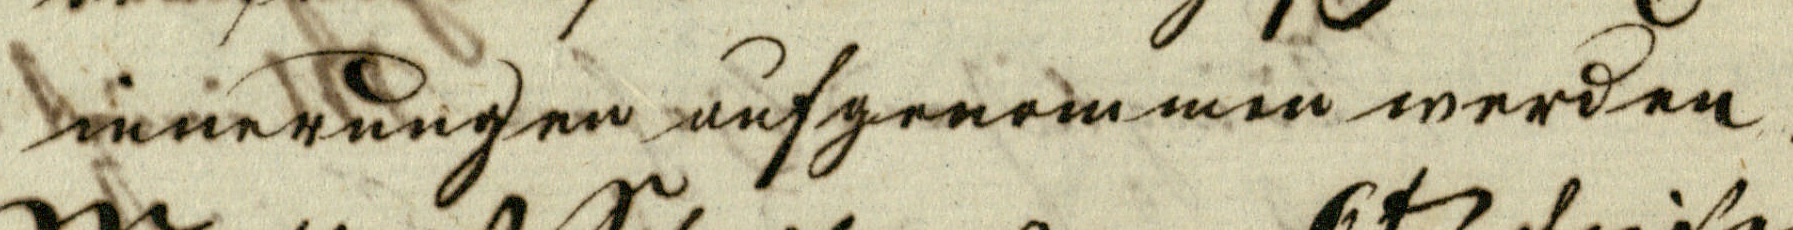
innerungen aufgenommen werden.
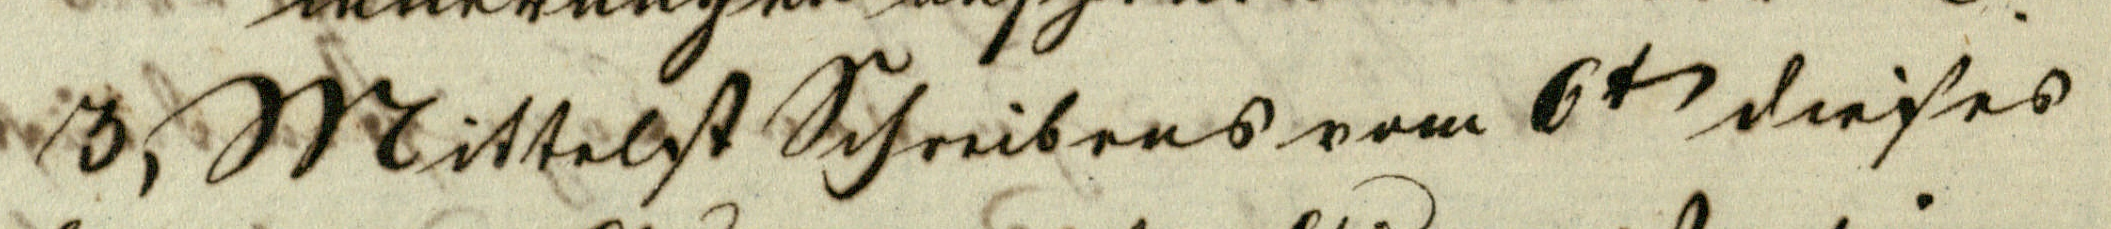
3, Mittelst Schreibens vom 6 te dieses
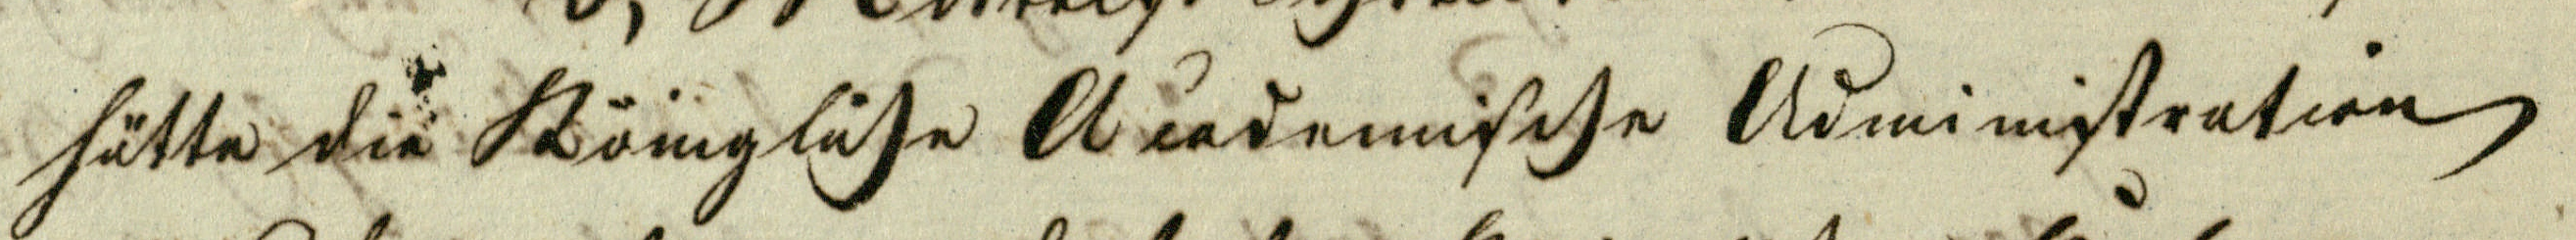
hätte das Köngliche Academische Administration
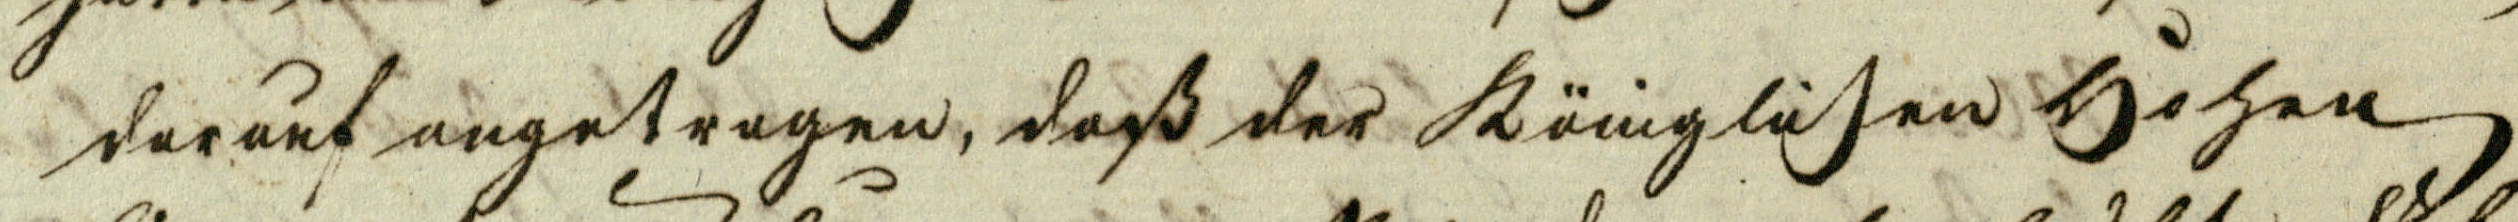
darauf angetragen, daß der Königlichen Hohen
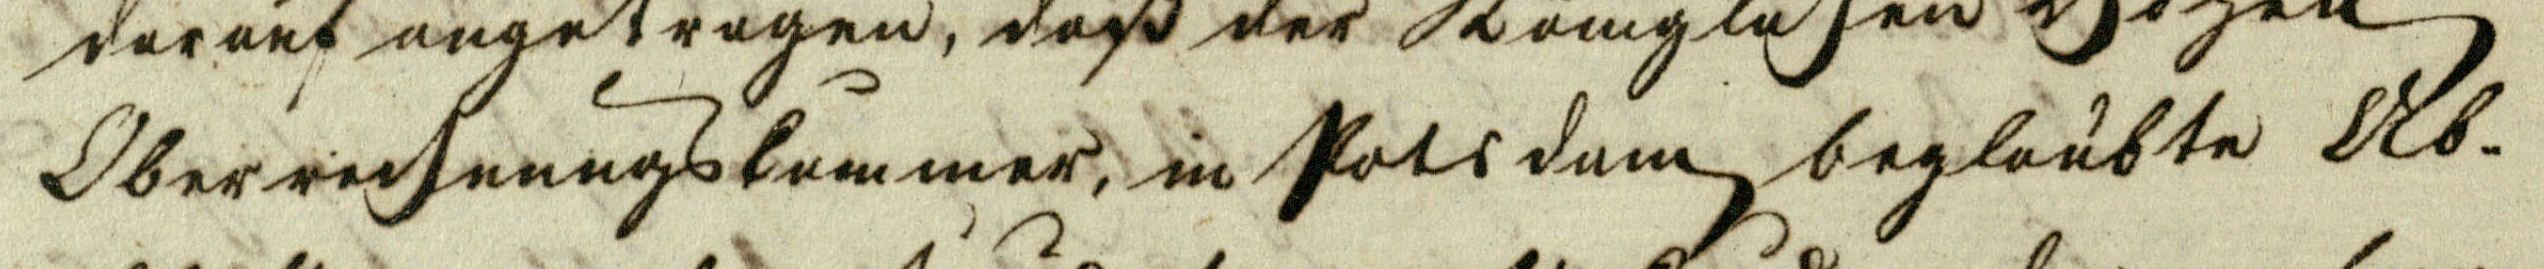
Oberrechnungskammer, in Potsdam beglaubte Ab¬
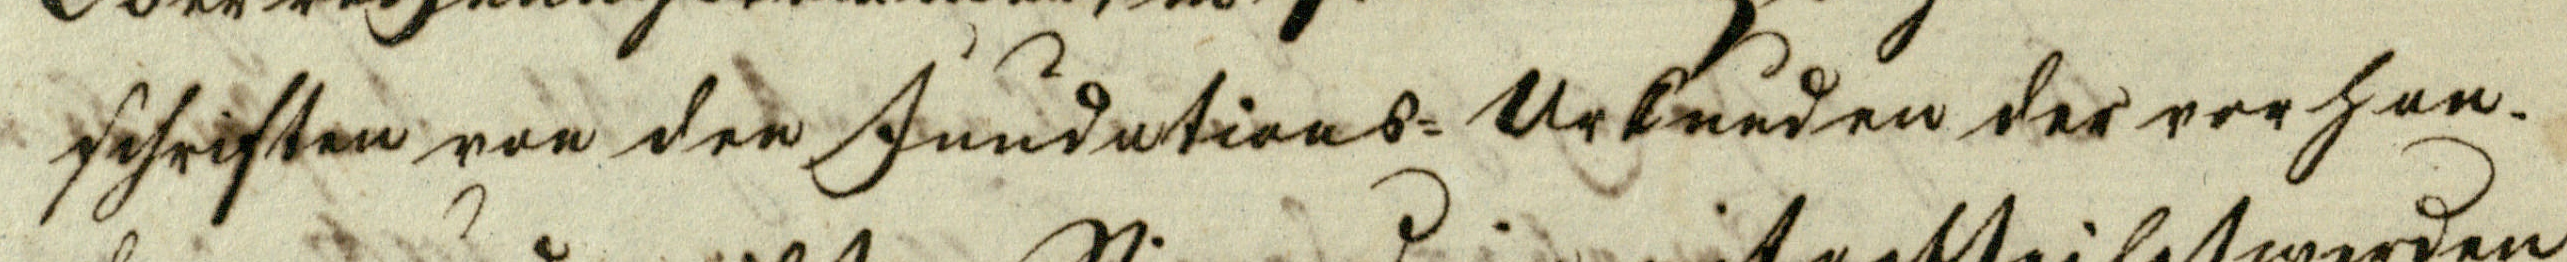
schriften von den Fundations Urkanden der vorhan¬
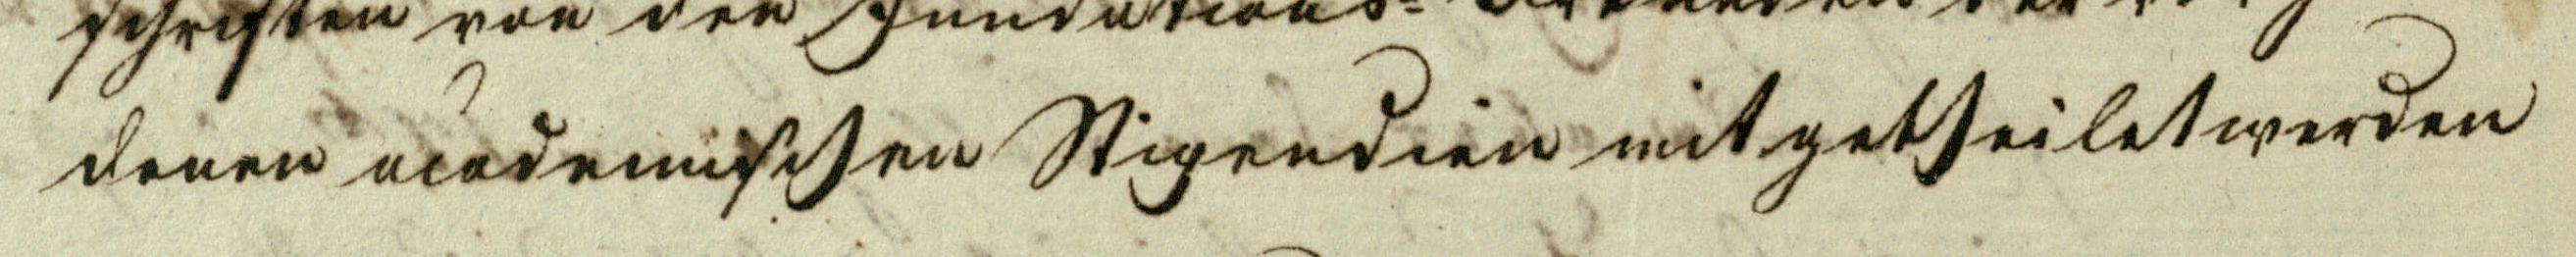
denen academischen Stipendien mitgetheilet werden
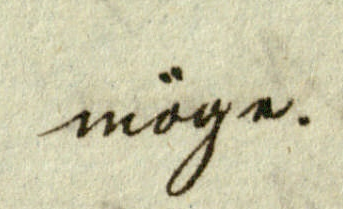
möge.
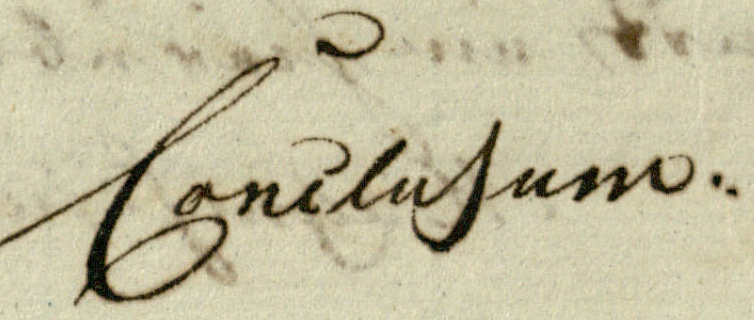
Conclusum:
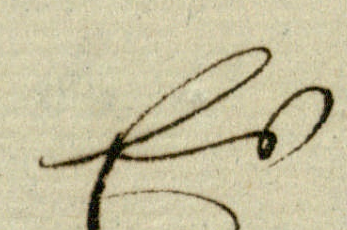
Es
